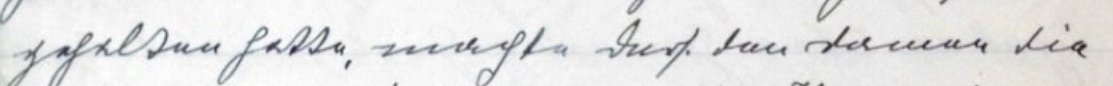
Schrader gehalten hatte, machte derf. den Damen die
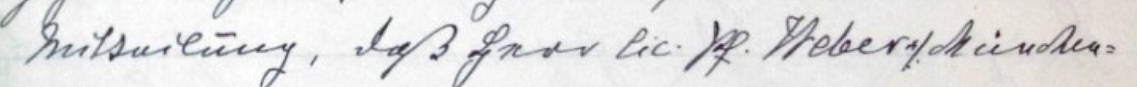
, daß Herr Lic. Pf. Weber München-
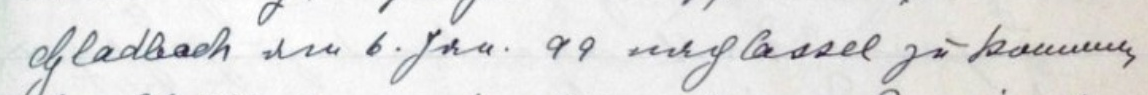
Gladbach am 6. Jan. 99 nach Cassel zu kommen
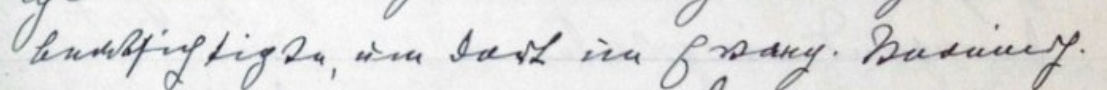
beabsichtigte, um dort im Evang. Vereinsh.
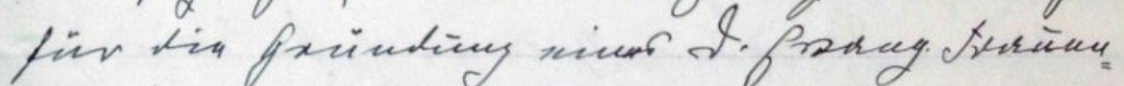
für die Gründung eines D. Evang. Frauen
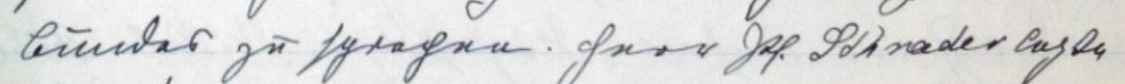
bundes zu sprechen. Herr Pfarrer Schrader legte
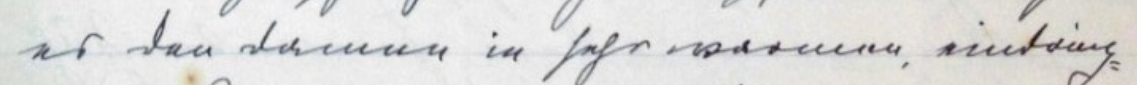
es den Damen in sehr warmen, eindring
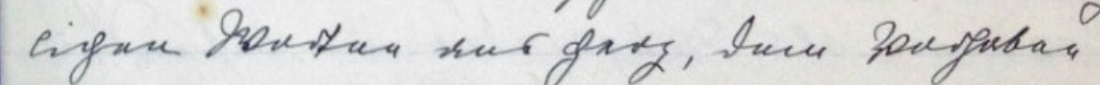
lichen Worten ans Herz, dem Vorhaben
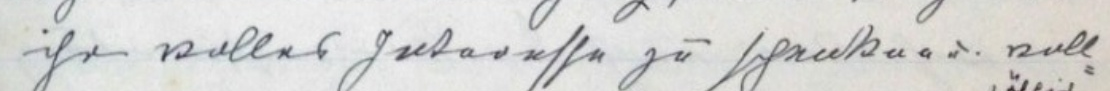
ihr volles Interesse zu schenken u. voll
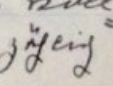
zählig
